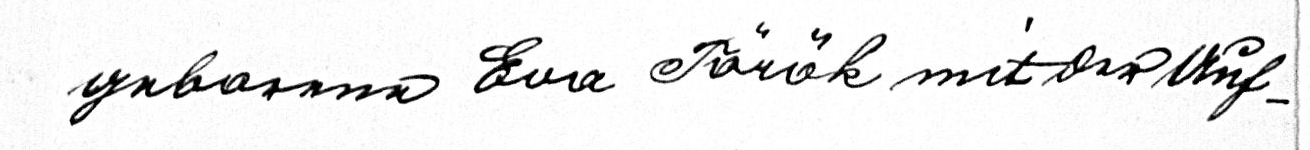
geborene Eva Török mit der Auf¬
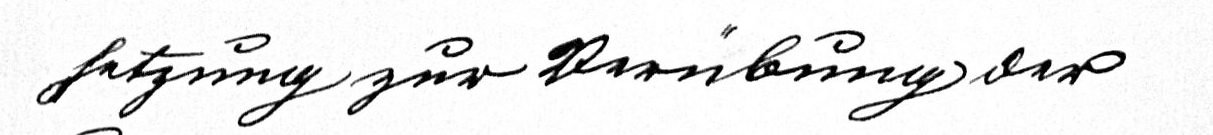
hetzung zur Verübung der
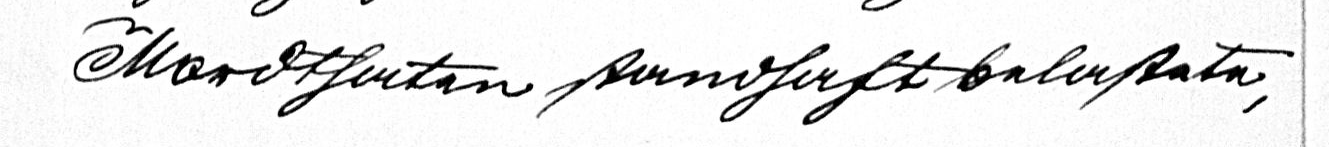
Mordthaten standhaft belastete,
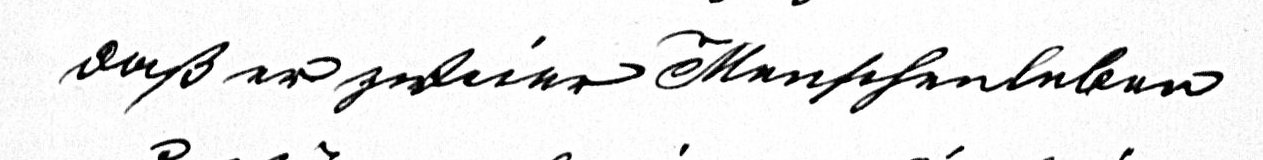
daß er zweier Menschenleben¬
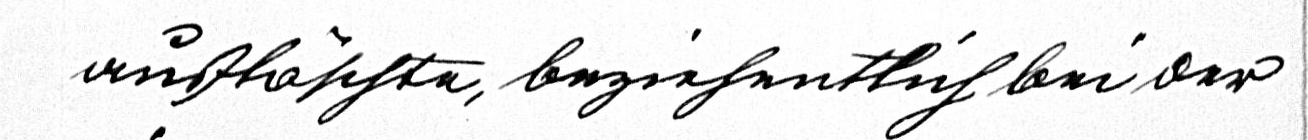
auslöschte, beziehentlich bei der
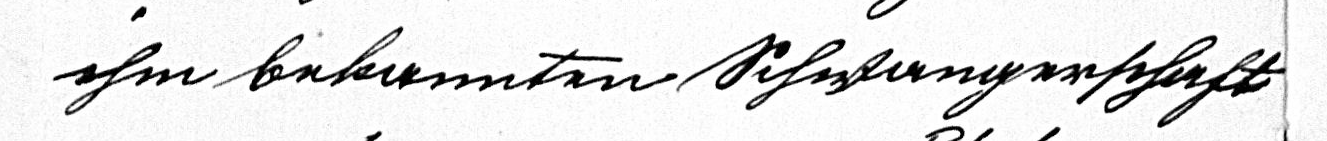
ihm bekannten Schwangerschaft
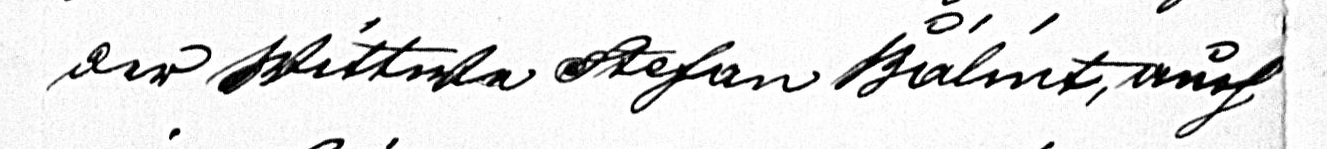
der Wittwe Stefan Bálint, auch
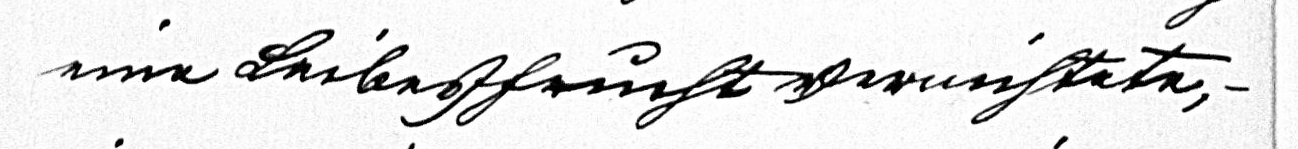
eine Leibesfrucht vernichtete, -
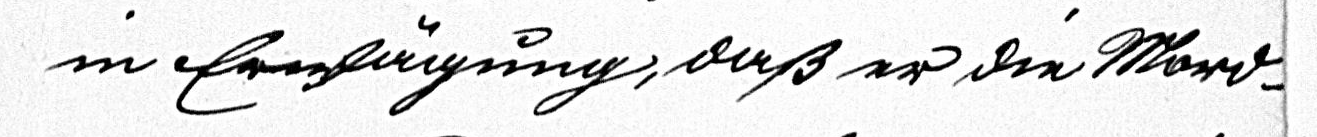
in Erwägung, daß er die Mord¬
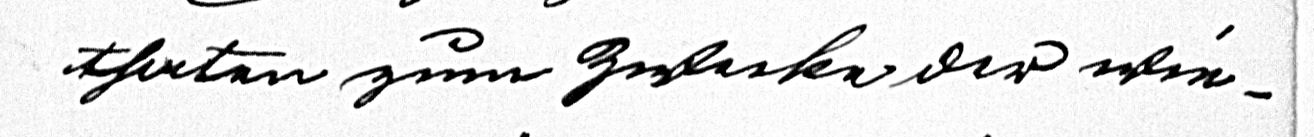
thaten zum Zwecke der wie¬
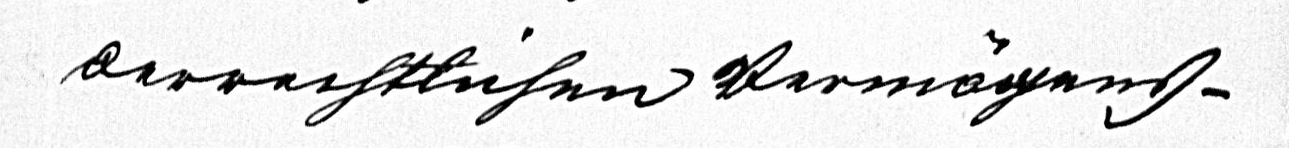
derrechtlichen Vermögens-
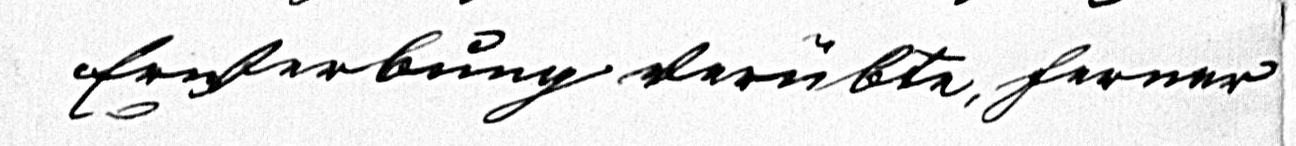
Erwerbung verübte, ferner
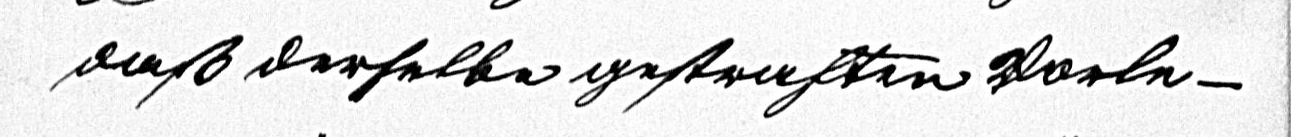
daß derselbe gestraften Vorle¬
